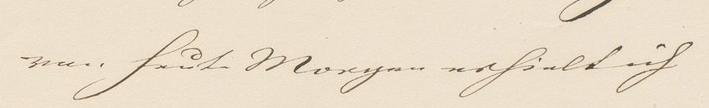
von heute Morgen erhielt ich
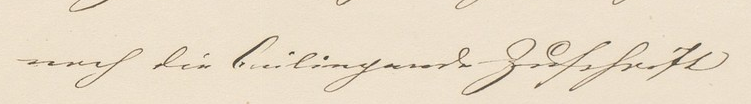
noch die beiliegende Zuschrift
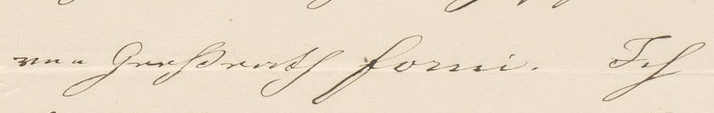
von Großrath Forni. Ich
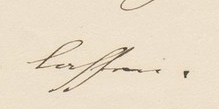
lassen.
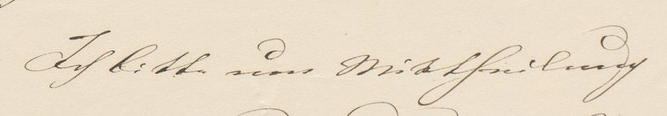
Ich bitte um Mittheilung
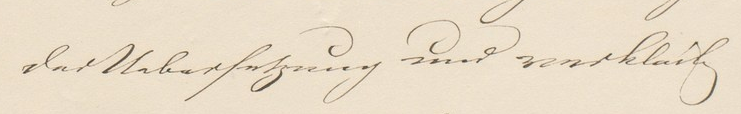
die Uebersetzung und verbleibe
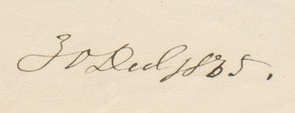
30 Decb 1865.
